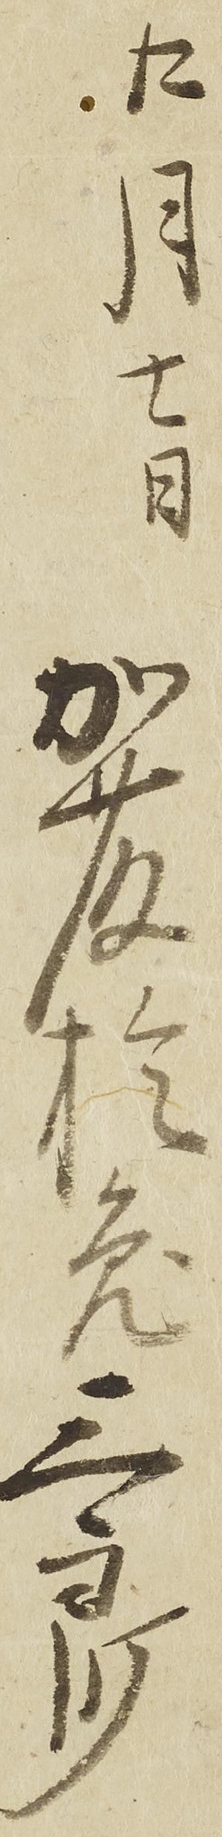九月七日加藤於兎三郎

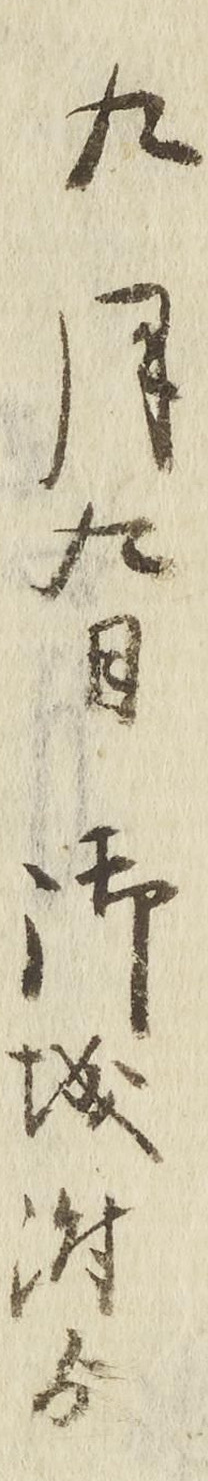九月八日御城附ゟ
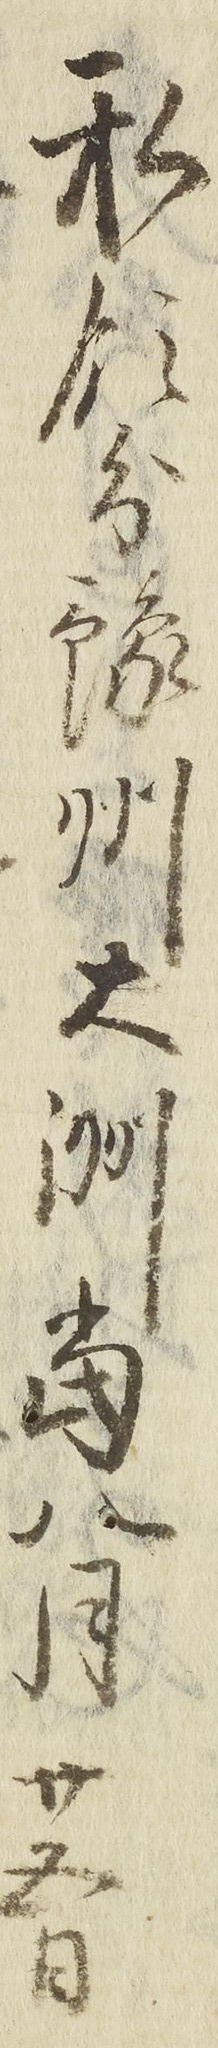一私領分予州大洲当八月廿五日
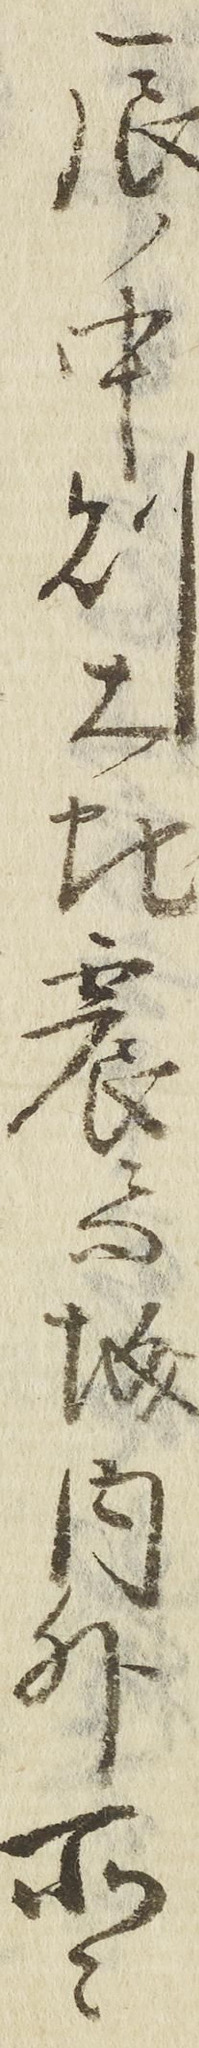辰ノ中刻土地震二而城内外所々
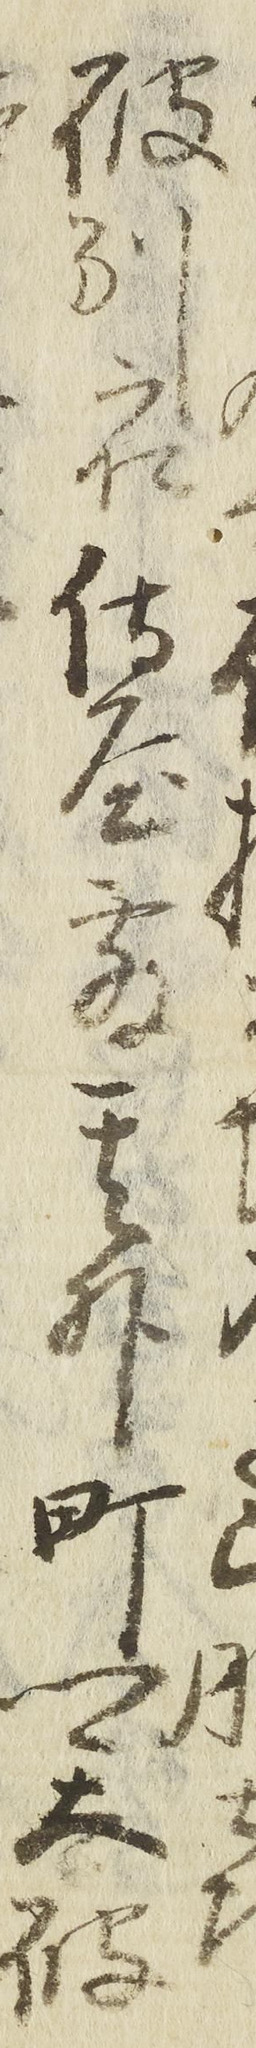破裂侍屋敷其外町郷大破
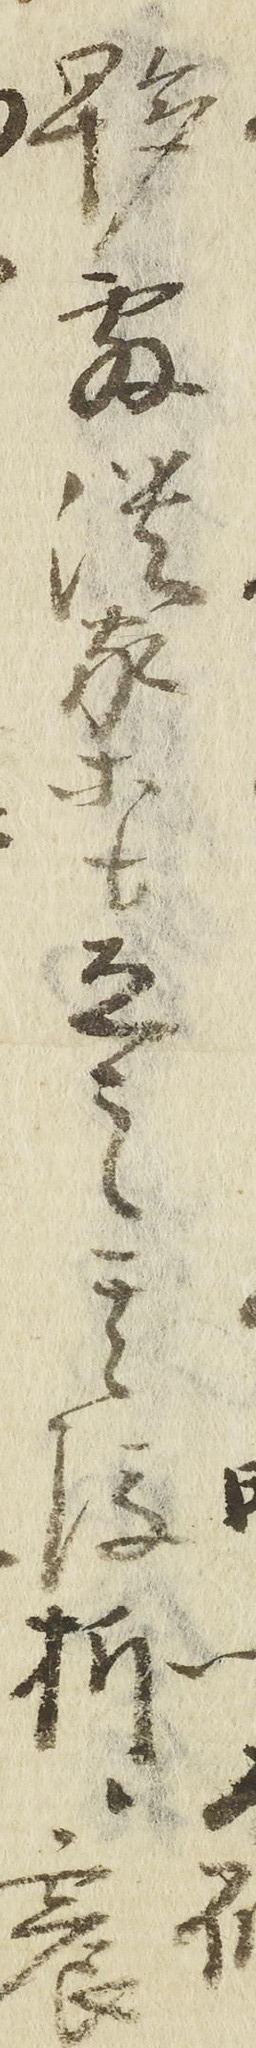夥敷潰家等も有之其後折々震
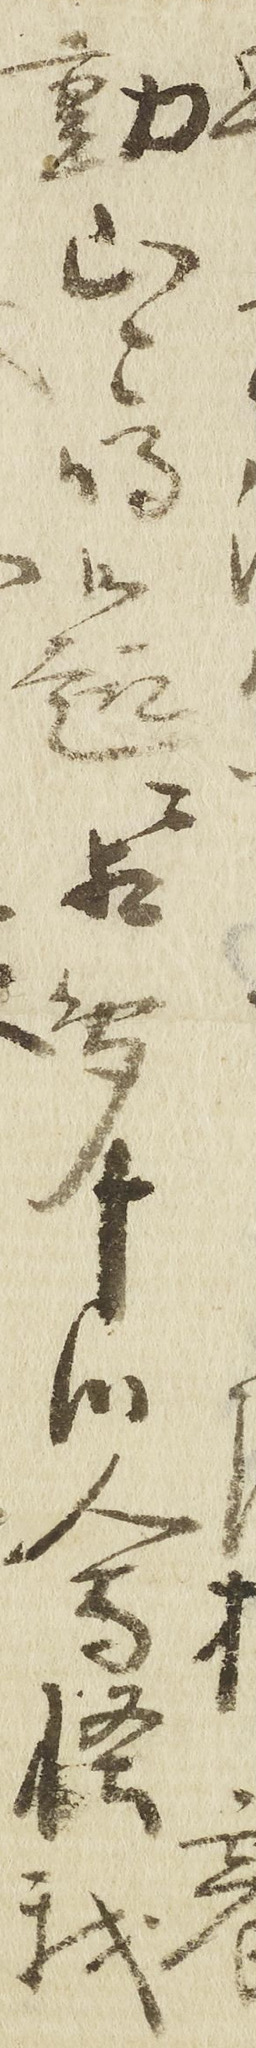動山々鳴候趣二相聞申候人馬怪我
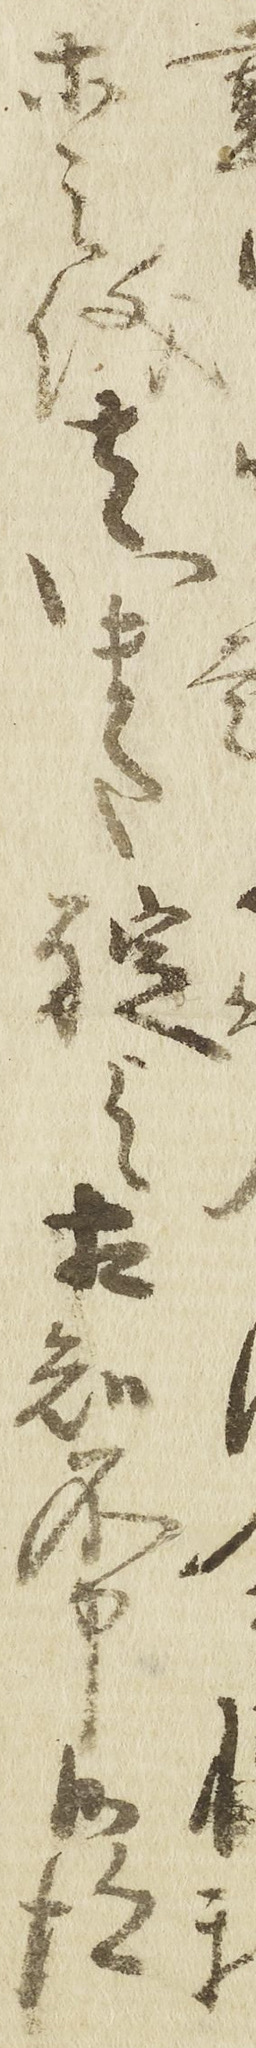等之儀はいまた聢と相知不申候得
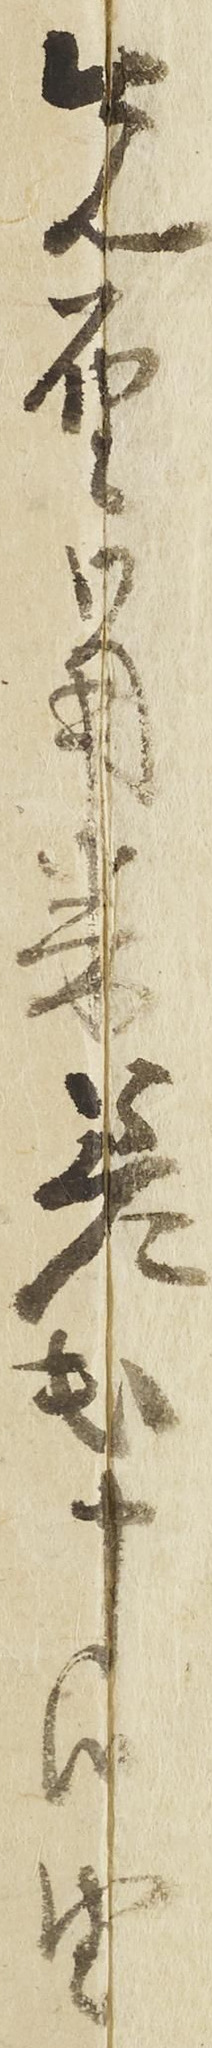先届御用番差出申候由
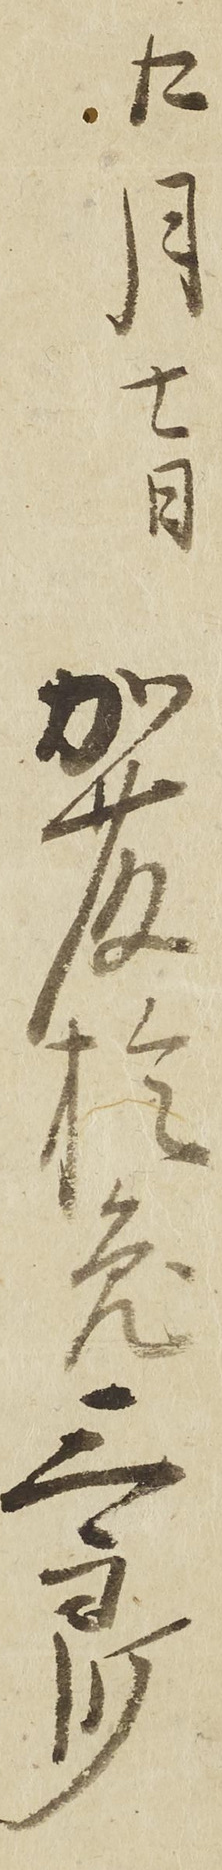九月七日加藤於兎三郎
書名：世説ヤンレフシ写、駿州田中城地震ニ付内外破損御届書、豫州大洲城地震ニ付内外破損御届書・封廻状
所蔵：東京大学地震研究所図書室 Earthquake Research Institute Library, The University of Tokyo, JAPAN
